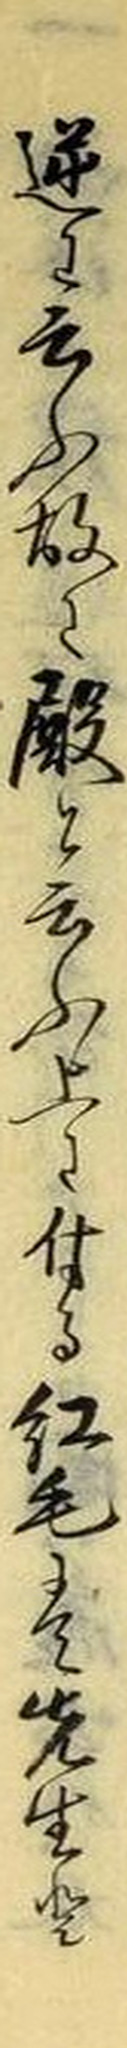逆に云ふ故に殿と云ふ上に付る紅毛にて先生と
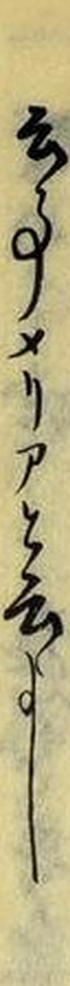云事メリアと云よし
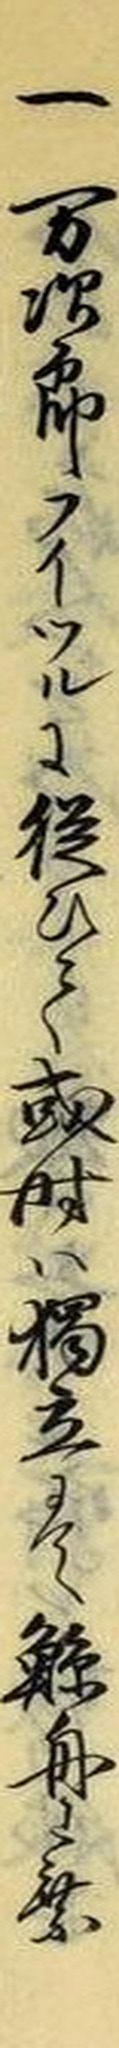一万次郎フイツルに従ひて或時ハ独立にて鯨舟に乗
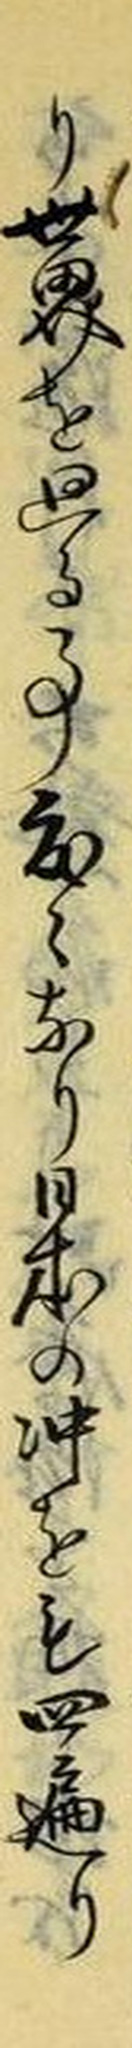り世界を廻る事度々なり日本の沖をも四遍り
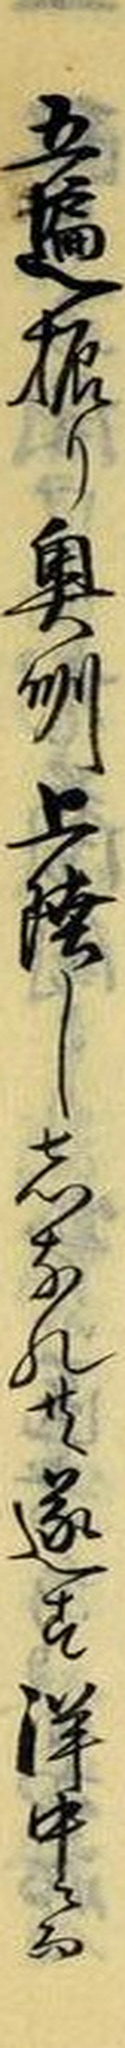五遍振り奥州上陸し志なれ共遂す洋中に而
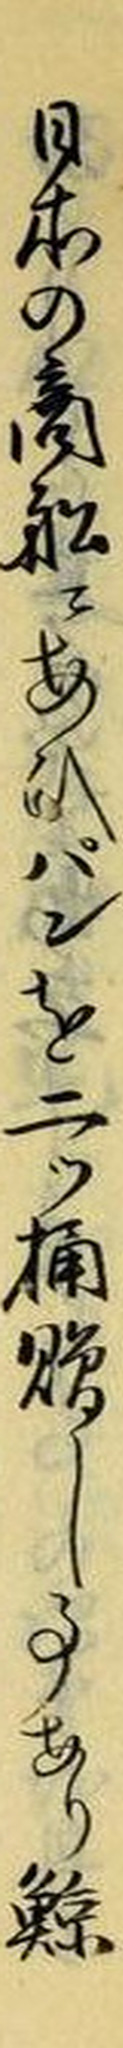日本の商船ニあひパンを二ツ桶贈しあり鯨
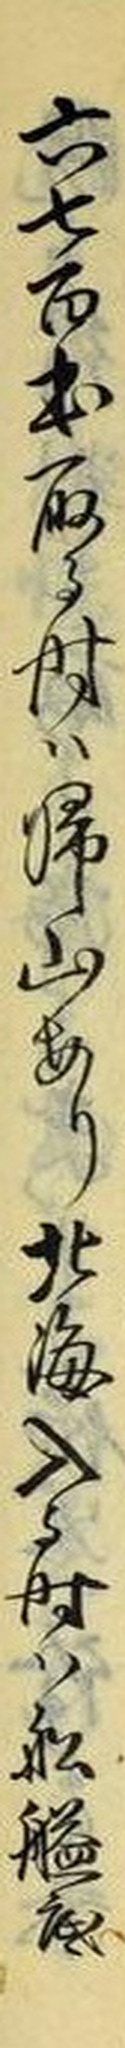六七百本取る時ハ帰山あり北海入る時ハ船艫底
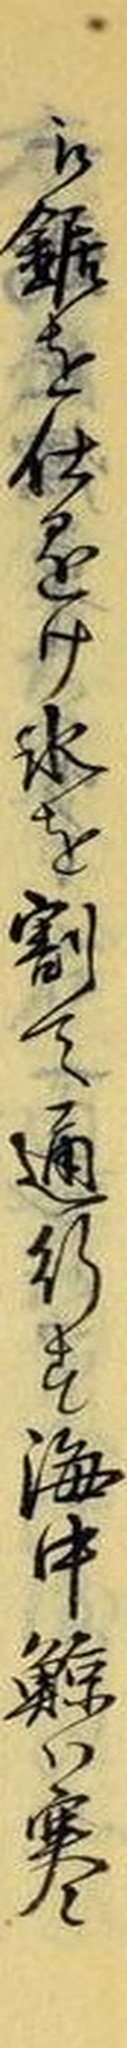江鋸を仕懸け氷を割て通行す海中鯨ハ寒
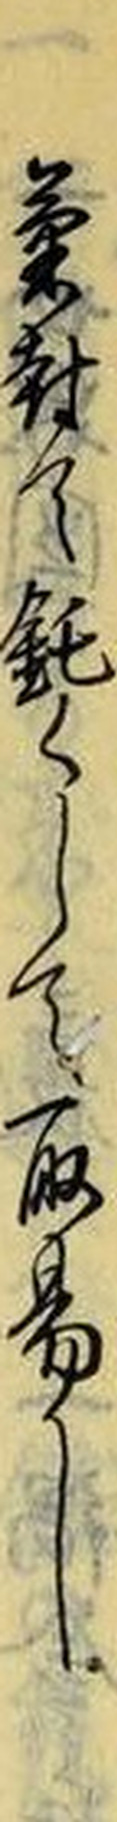気封て鈍くして取易し
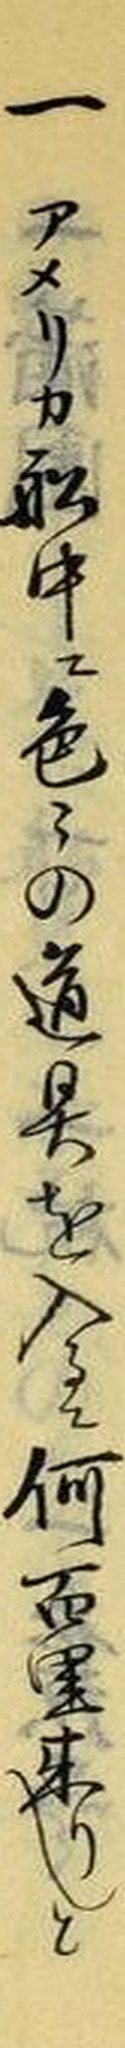一アメリカ船中ニ色々の道具を入るニ何百里来りしと
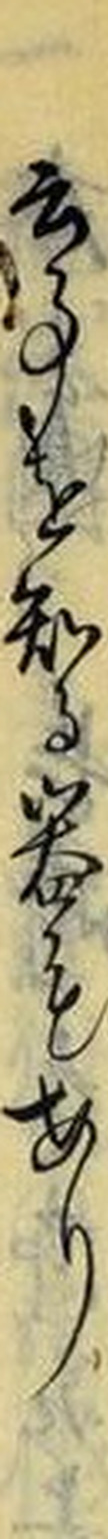云事を知る器もあり
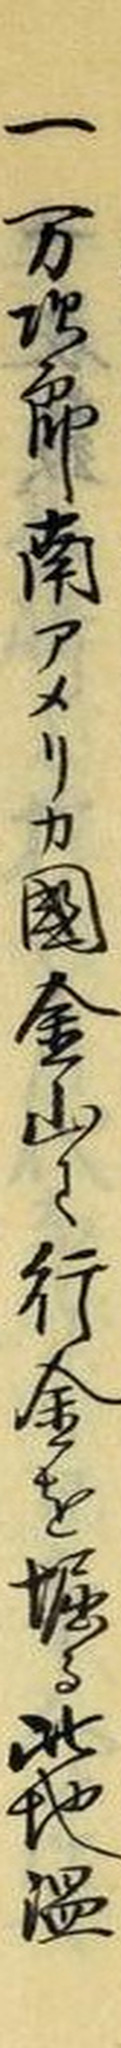一万次郎南アメリカ国金山に行金を掘る此地温
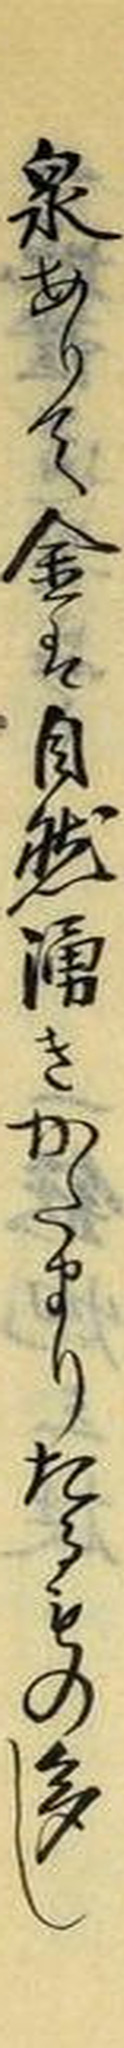泉ありて金は自然湧きかたまりたるもの多し
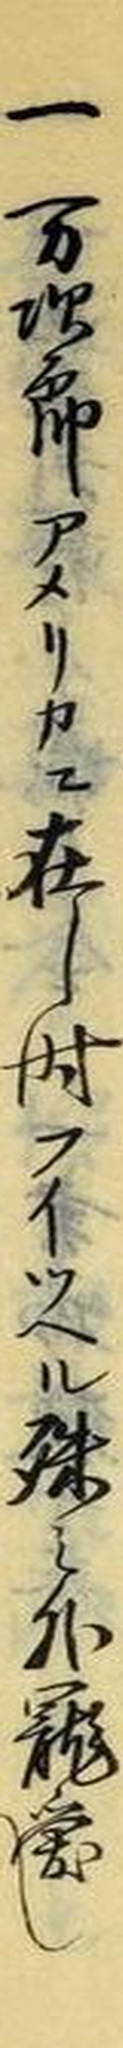一万次郎アメリカニ在し時フイツヘル殊之外寵愛し
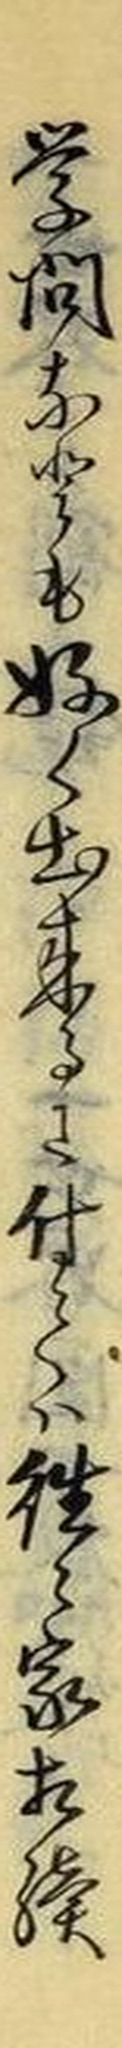学問なとも好く出来るに付てハ往々家相続
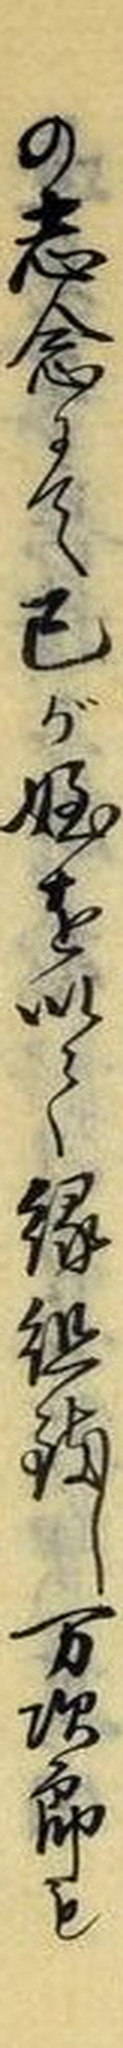の志念にて己が姪を以て縁組致し万次郎を
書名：漂客談奇（備考雑録写8）
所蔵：福井県文書館 Fukui Prefectural Archives
